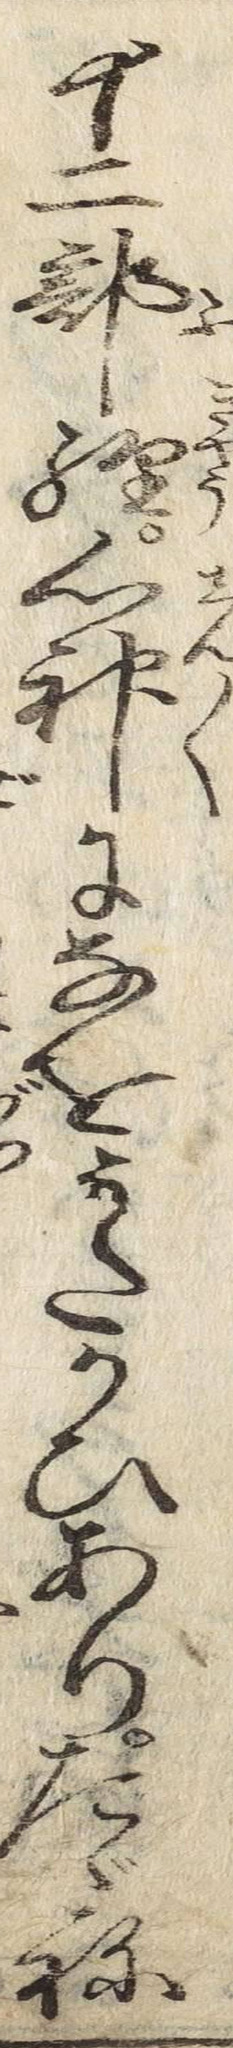十二部経。心神になをうたかひあり。たゞね
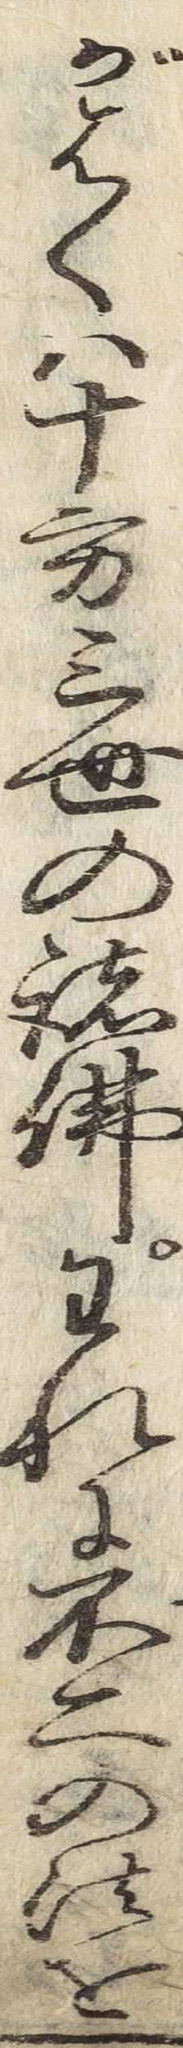がはくは十方三世の諸仏。われに不二の法を
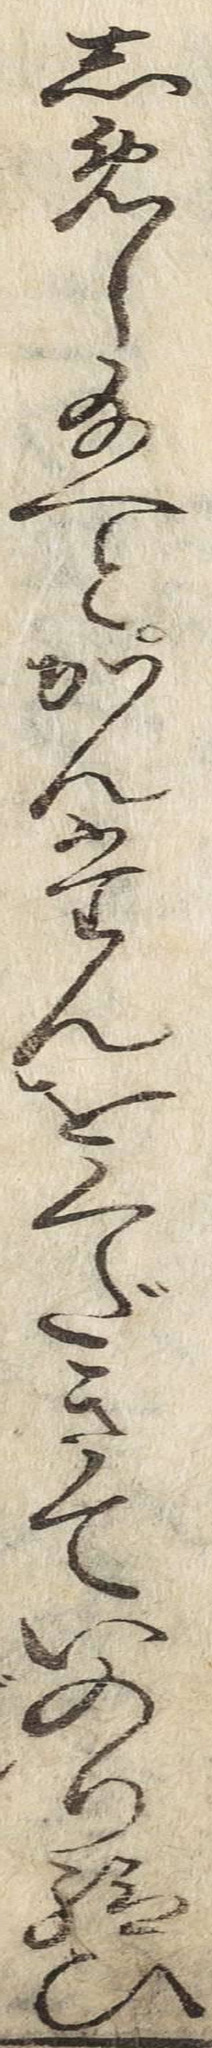しめし給へと。かんたんをくだきていのり給ひ
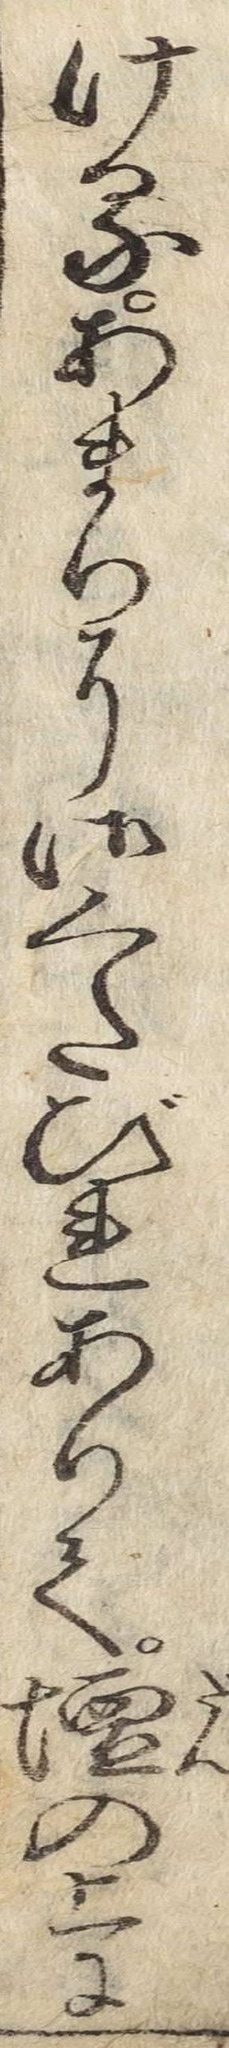ける。あまりに御くたびれありて。壇の上に

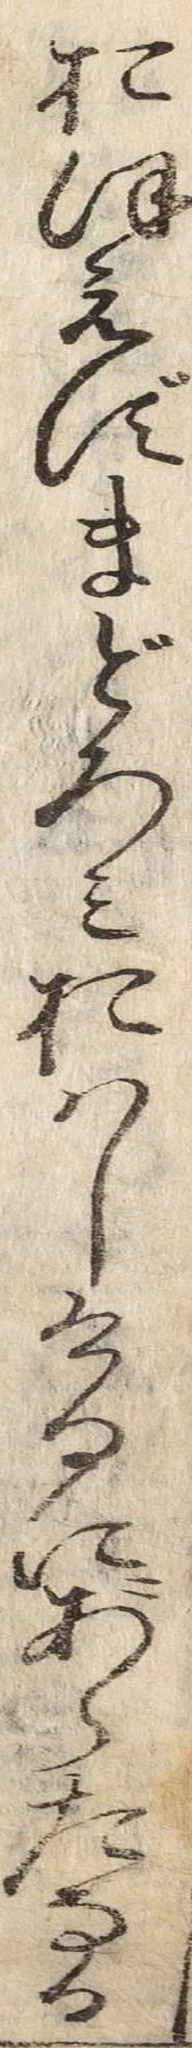おほえずまどろみおはしけるに。あらたなる
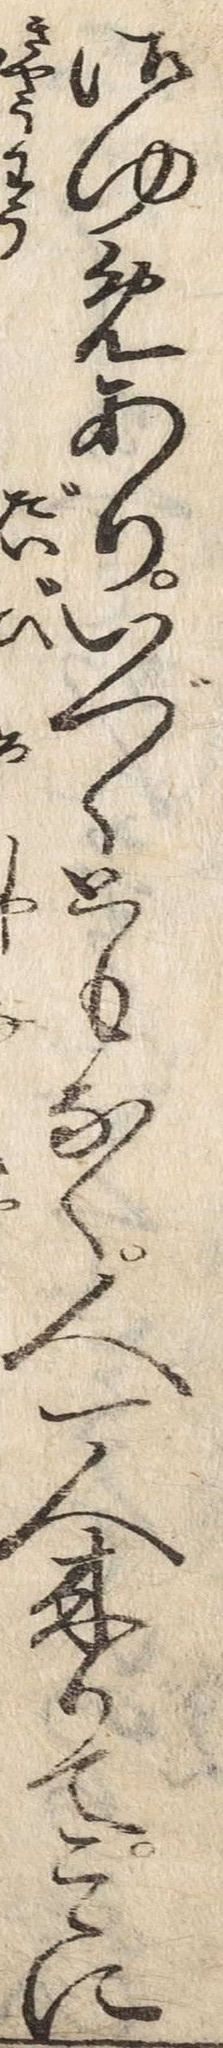御ゆめあり。いづくともなく。人一人来りて。こゝに
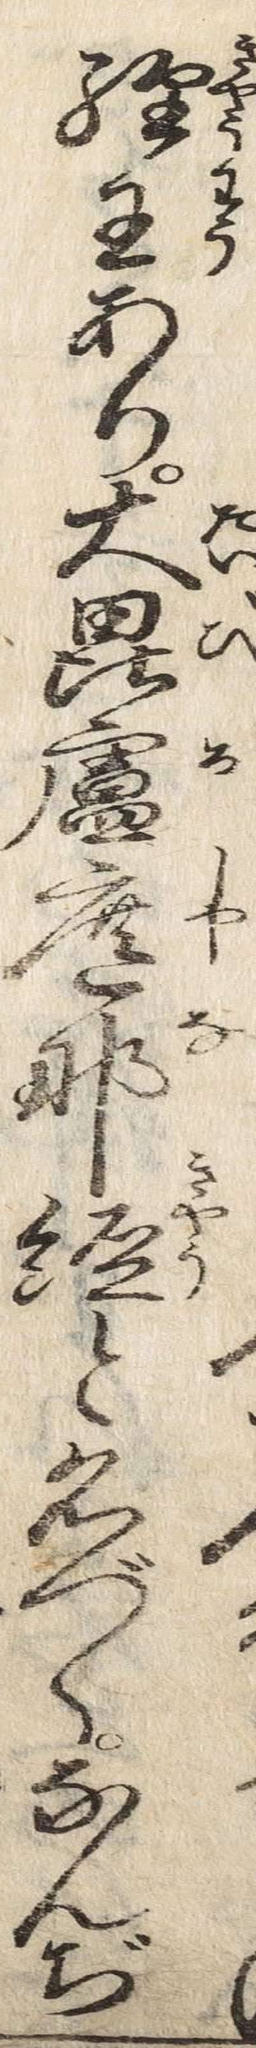経王あり。大毘盧遮那経と名づく。なんぢ
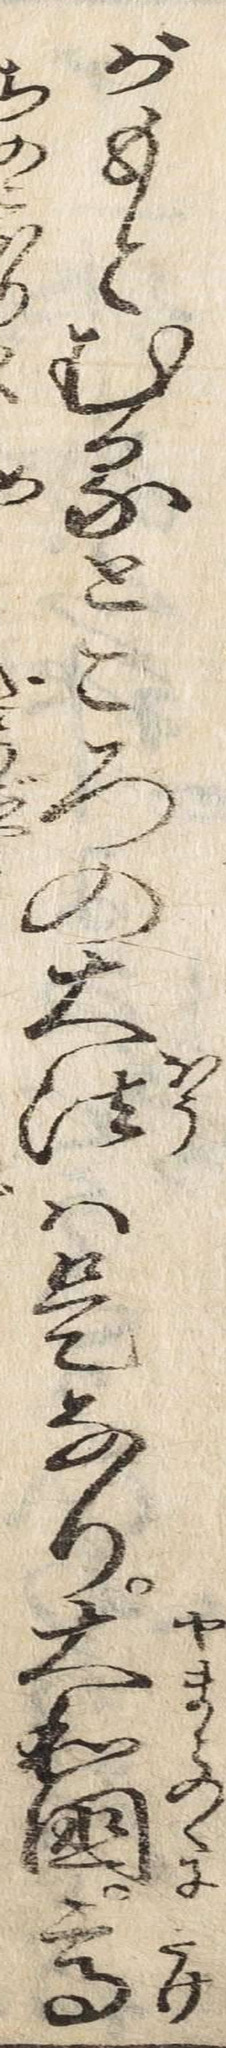がもとむるところの大法は是なり。大和国。高
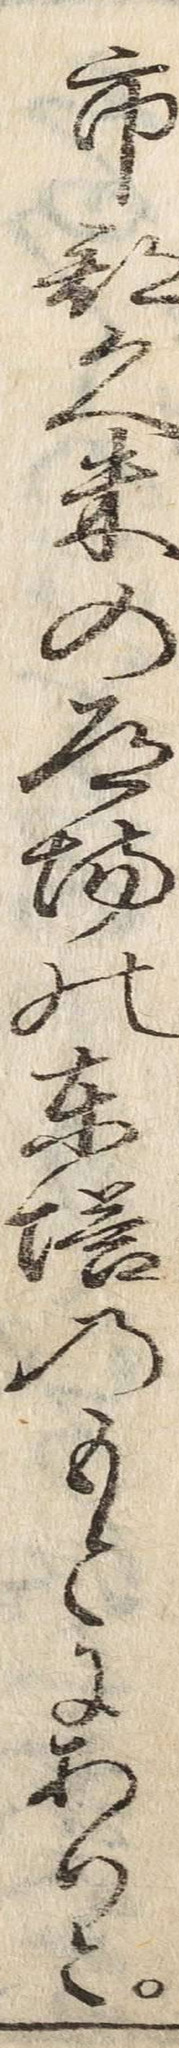市郡久米の道場の東塔のもとにありと。
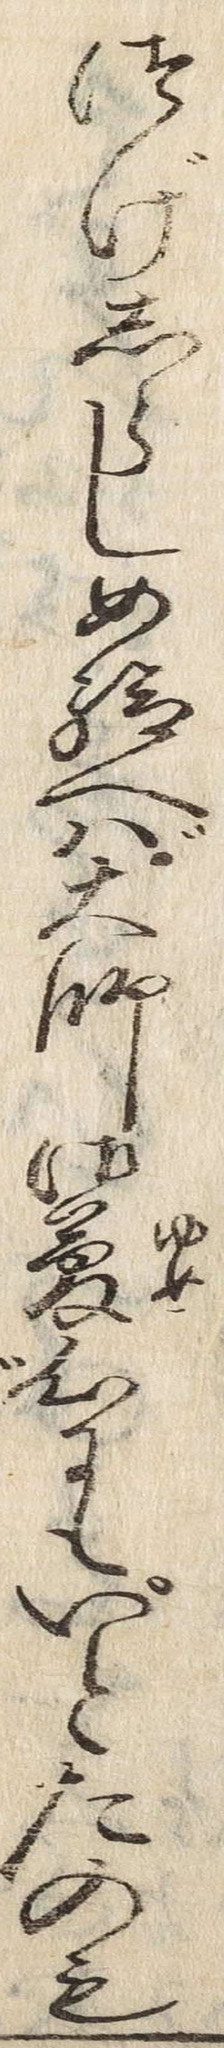つげしらしめ給へば、大師御夢心にも。いとたのも
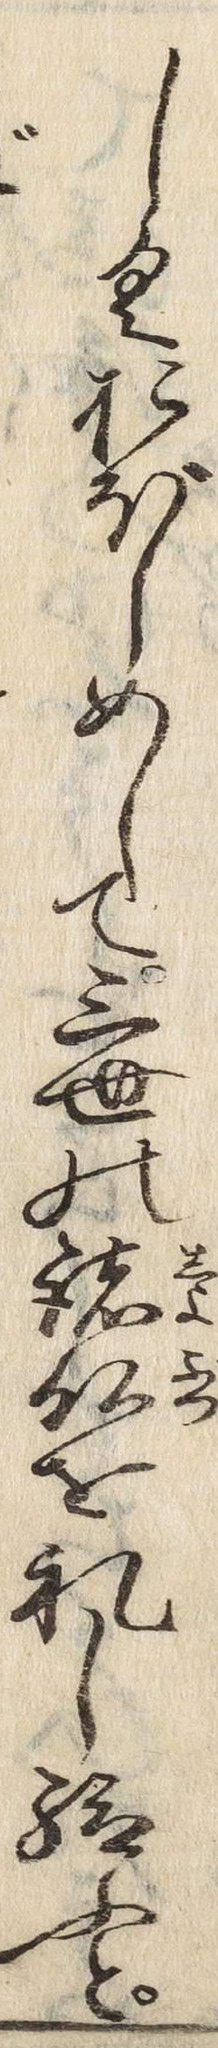しくおぼしめして。三世の諸仏を礼し給ふと。
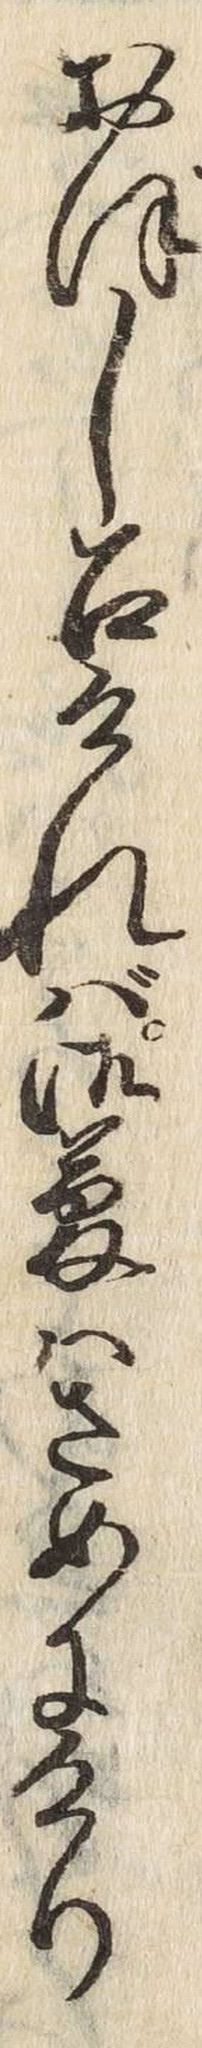おぼし召ければ。御夢はさめにけり

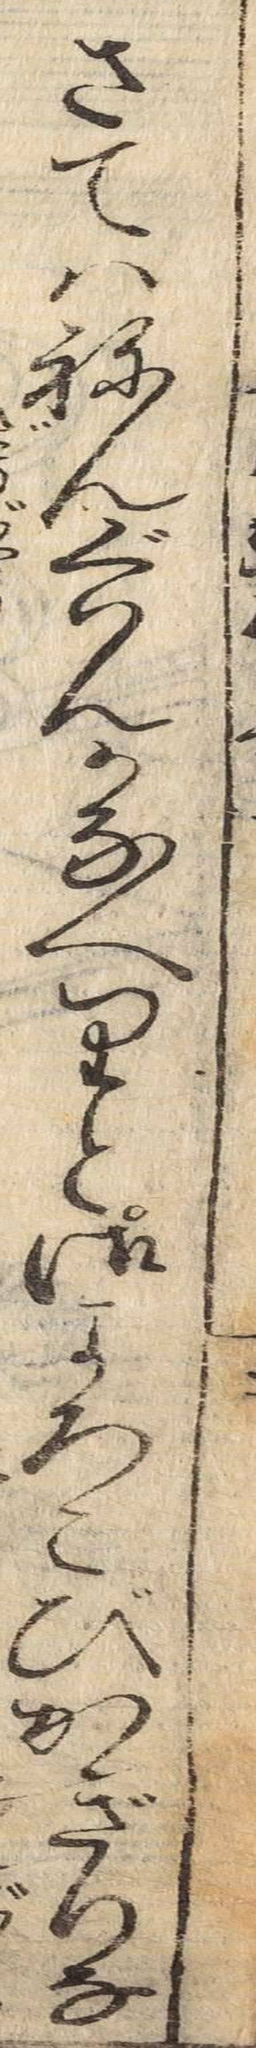さてはねんぐはんかなへりと。御よろこびかぎりな
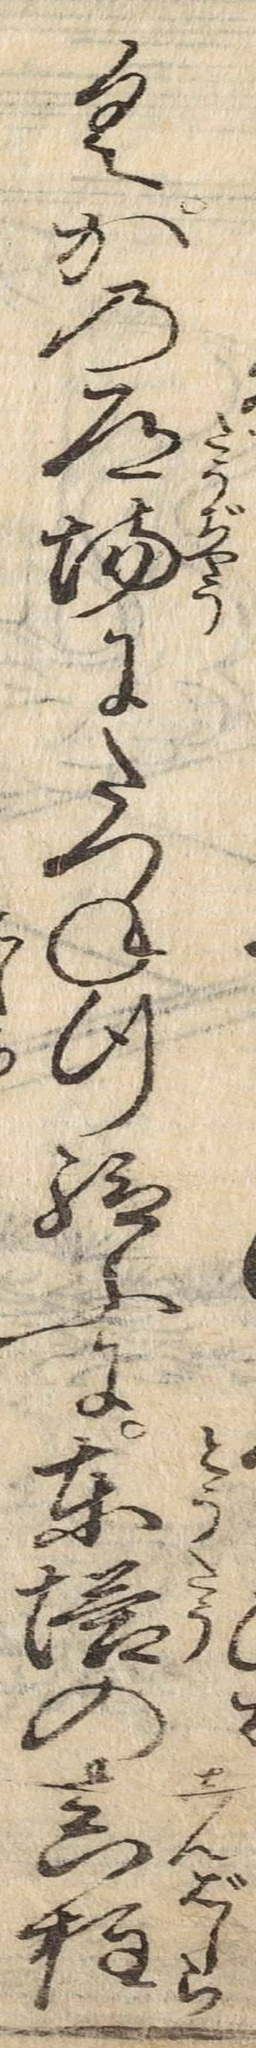く。かの道場にたつね行給ふに。東塔の真柱
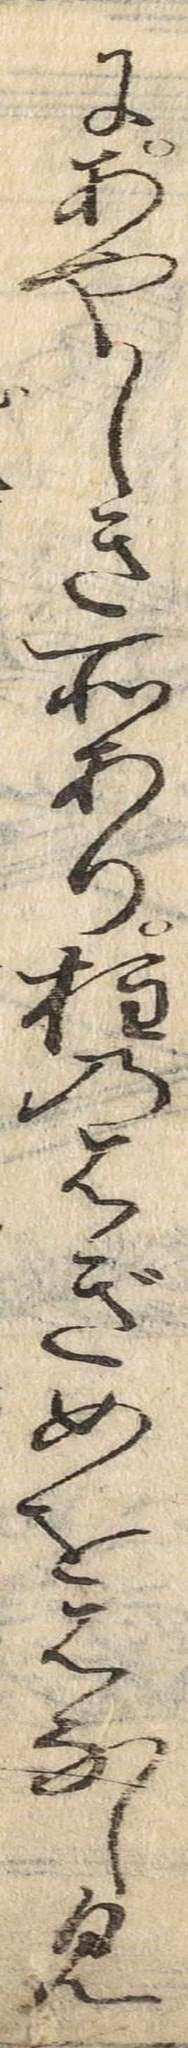に。あやしき所あり。柱のはぎめをはなし見
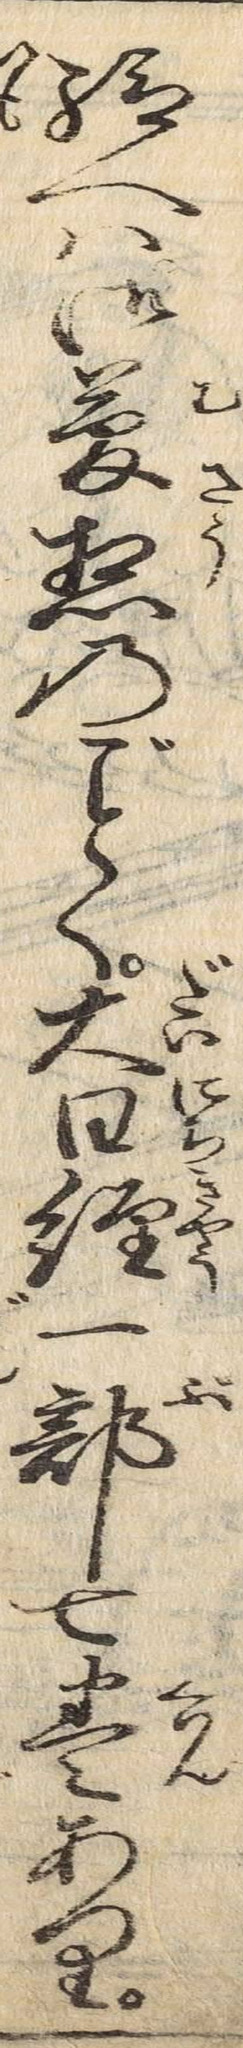給へは御夢想のごとく。大日経一部七巻あり。
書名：弘法大師御傳記
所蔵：京都府立京都学・歴彩館 国文学研究資料館
